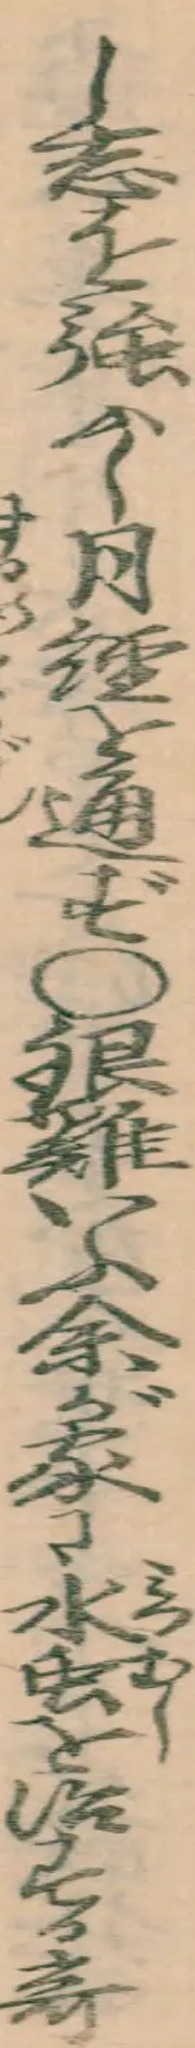し志を強ふし月経を通ず○銀雞いふ余が家に水虫を治する奇
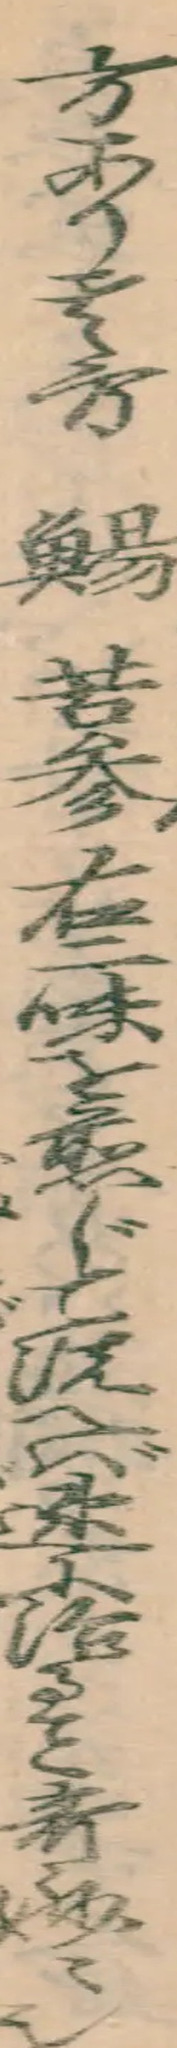方あり其方鯣苦参右二味を煎じて洗へば速に治ること奇々妙々也
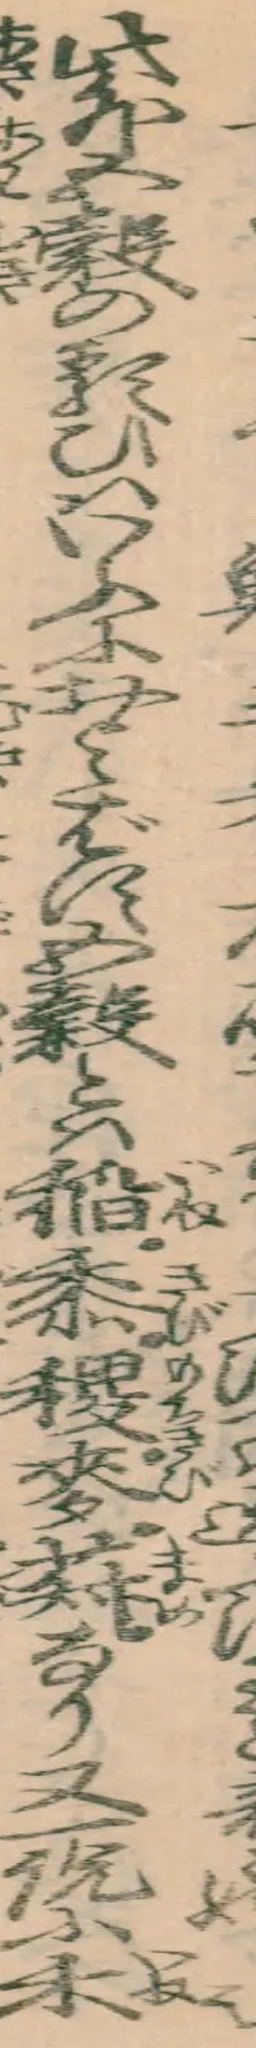此外五穀の類ひはいふにおよばす五穀とは稲．黍．稷．麦．菽．なり又一説に禾
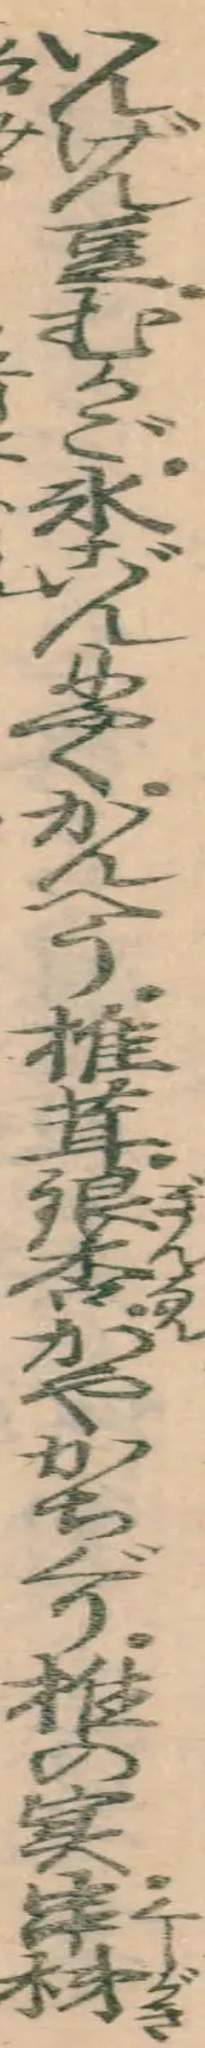いんげん豆．むかご．氷ごんにやく．かんへう．椎茸．銀杏．かやかちぐり．椎の実．串柿
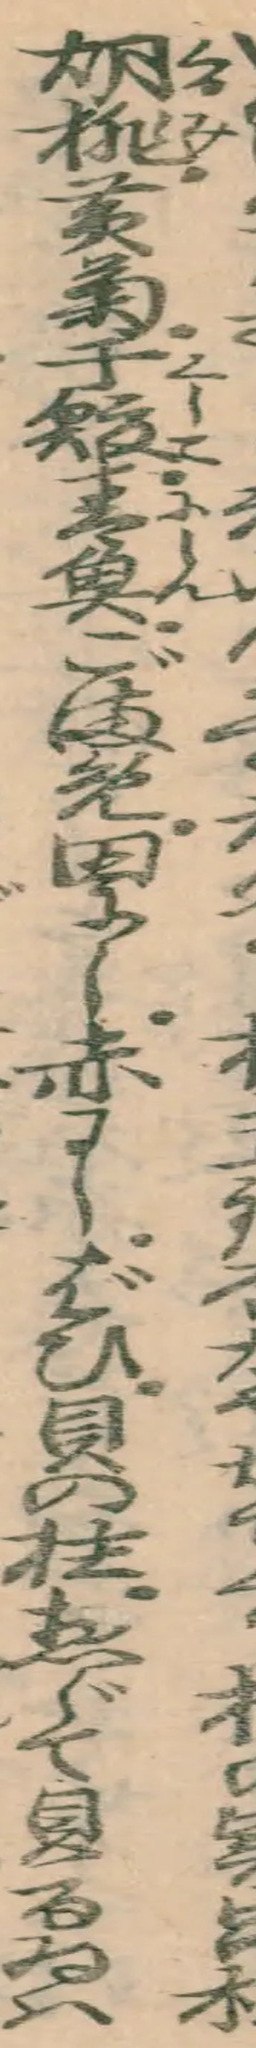胡桃．黄菊．干鰒．青魚．ごまめ．田にし．赤にし．ばひ．貝の柱．惣じて貝るゐは
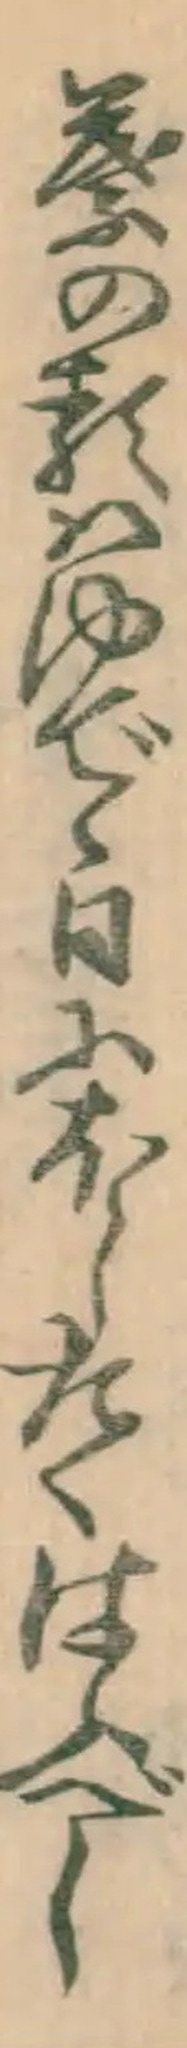葉の類はゆでゝ日にほしたくはふべし

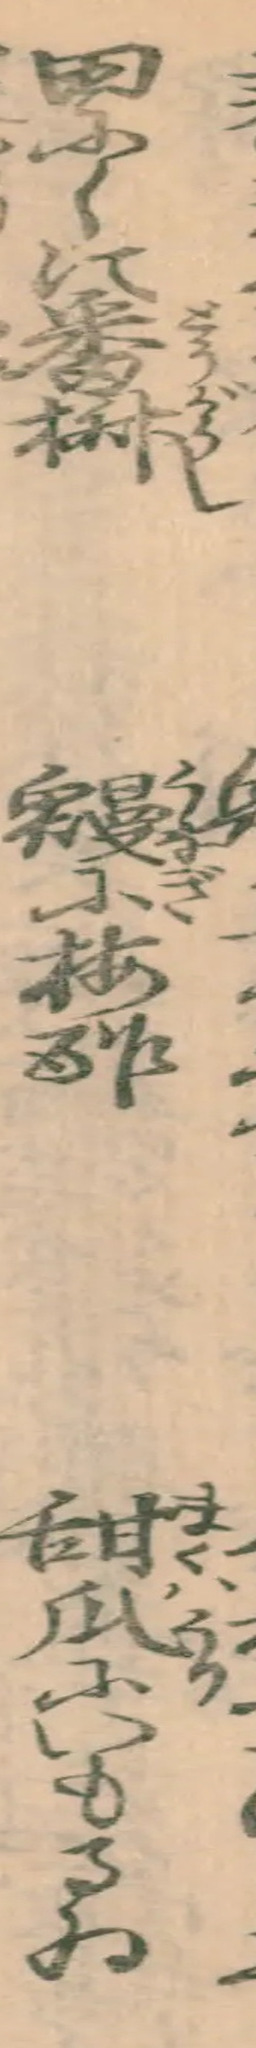田にしに番桝鰻に梅酢甜瓜にいもるゐ
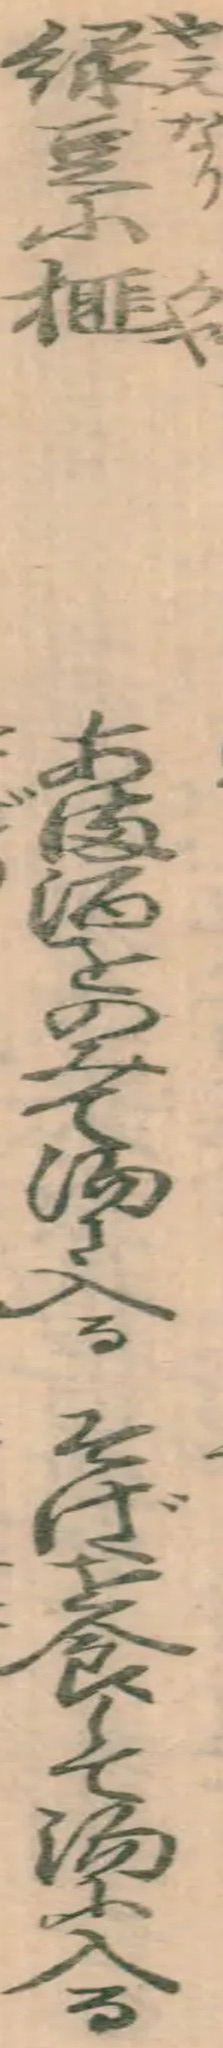緑豆に榧あま酒をのみて湯に入るそばを食して湯に入る
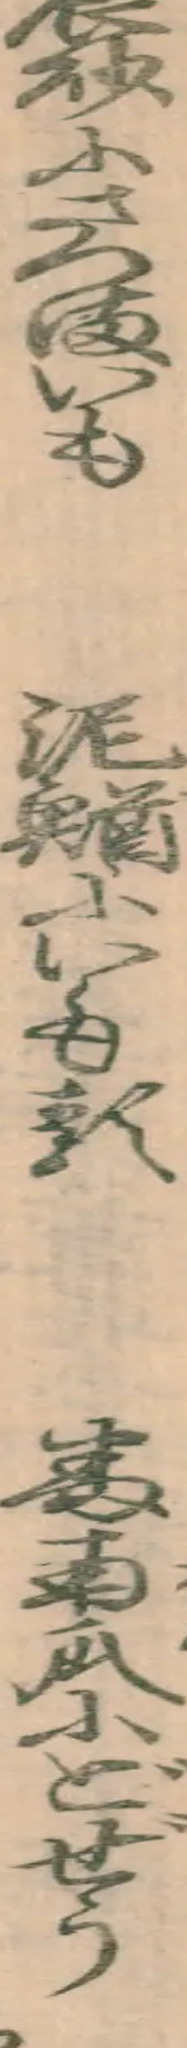辰砂にさつまいも泥鰌にいも類番南瓜にどぜう
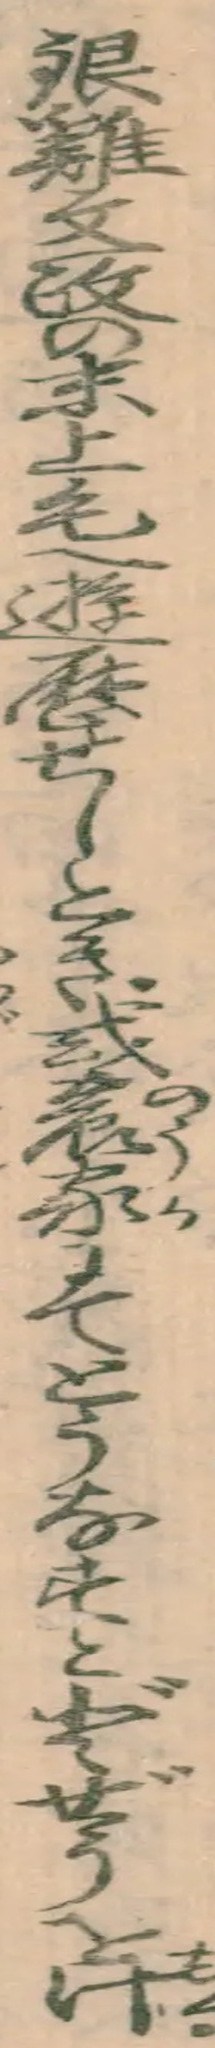銀雞文政の末上毛へ遊歴せしとき。或農家にてとうなすとどぜうを汁
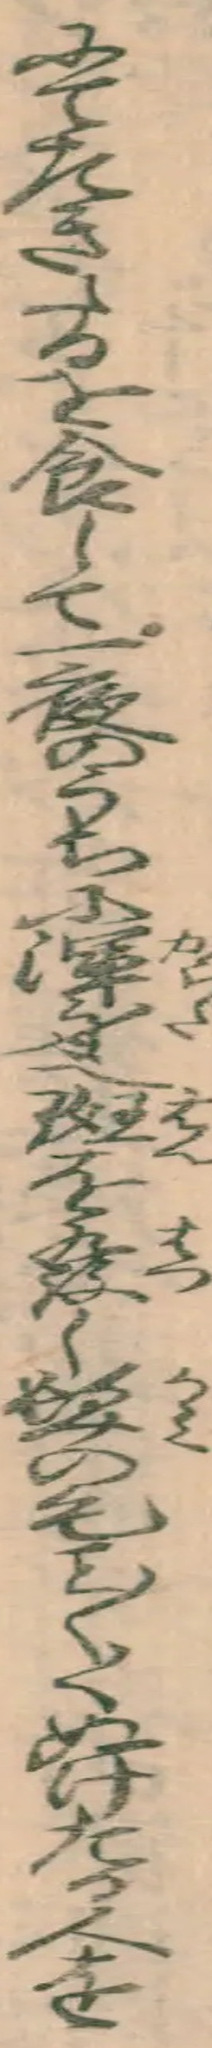にてたきたるを食して。一夜のうちに渾身へ斑を発し髪の毛こと〳〵くぬけたる人を
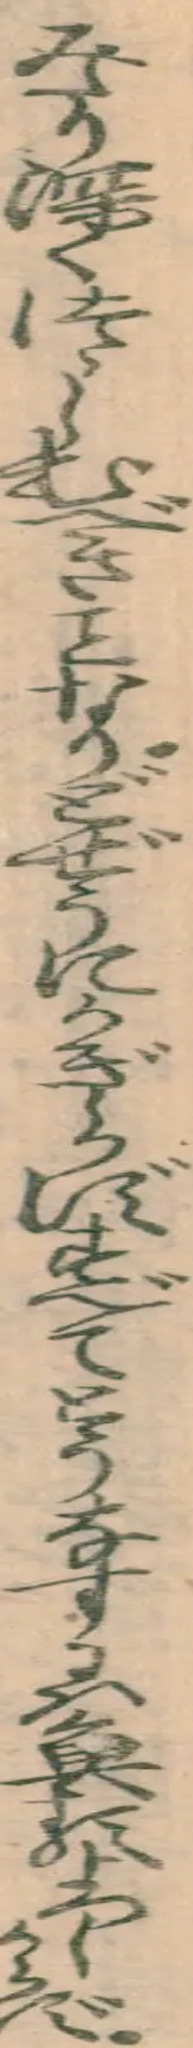みたり深くつゝしむべきことなり。どぜうにかぎらずすべてとうなすには魚類よろしからず。
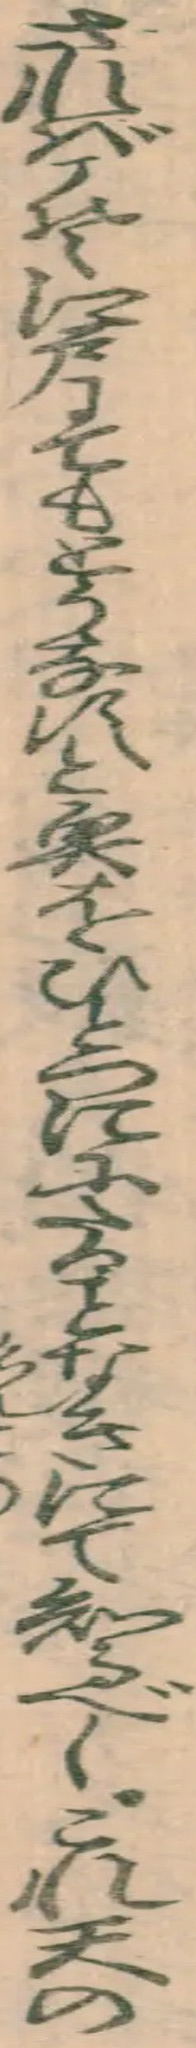さればこそ江戸にてもとうなすと魚をひとつににたることなきにて知るべし。これ天の
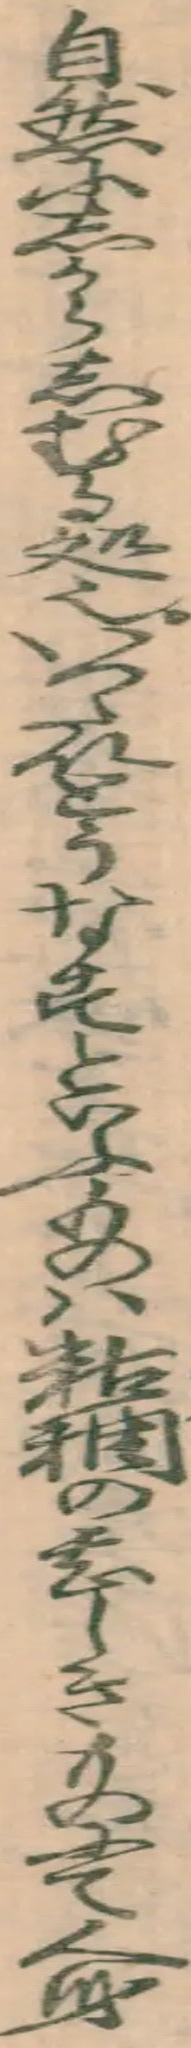自然にしからしむる処也。いつたいとうなすといふものは粘稠の甚しきものにて人身
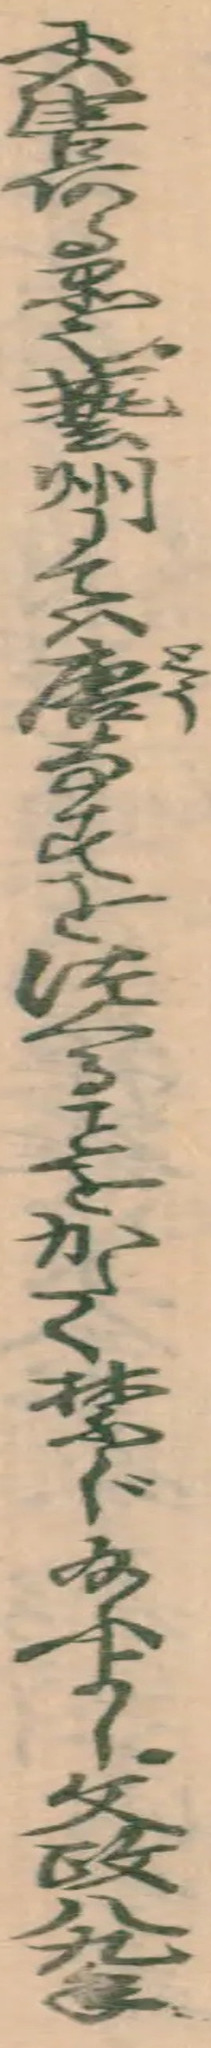には害ある品也。芸州にては唐なすをつくるをかたく禁じ給ふよし。文政八九年
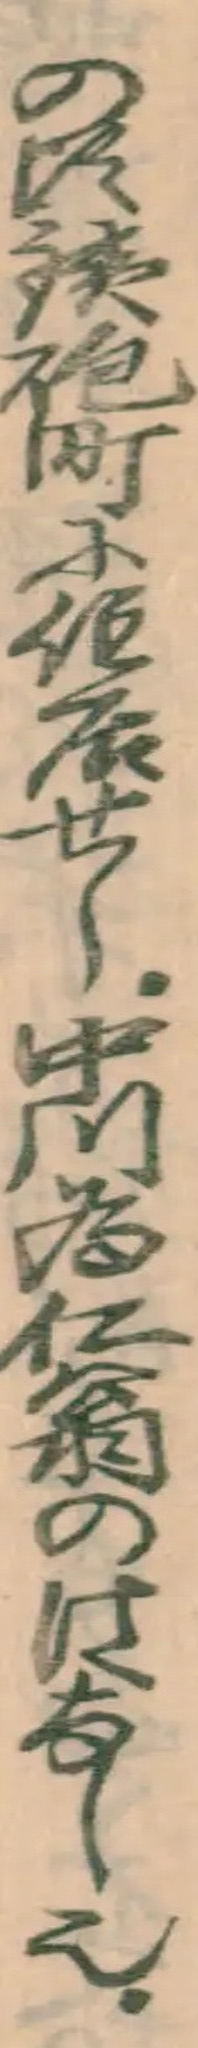の頃鉄砲町に住居せし。中川為仁翁のはなし也。
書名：日ごとの心得
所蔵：国立国会図書館 National Diet Library, JAPAN
